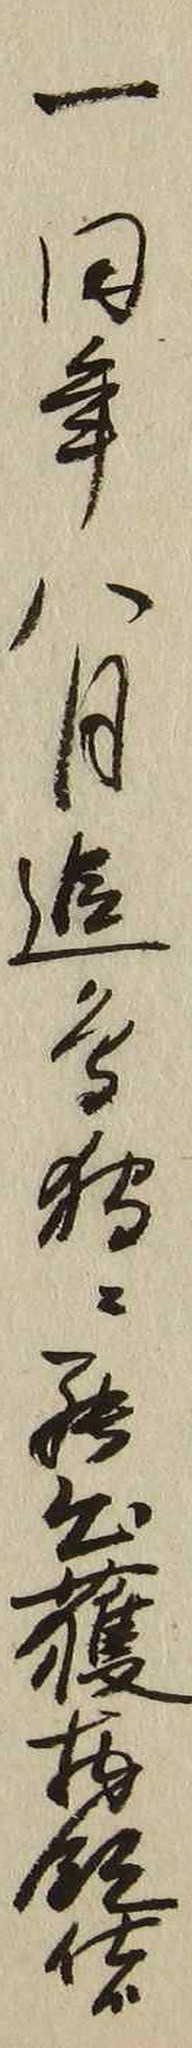一同年八月追鳥狩ニ罷出獲拝領仕候
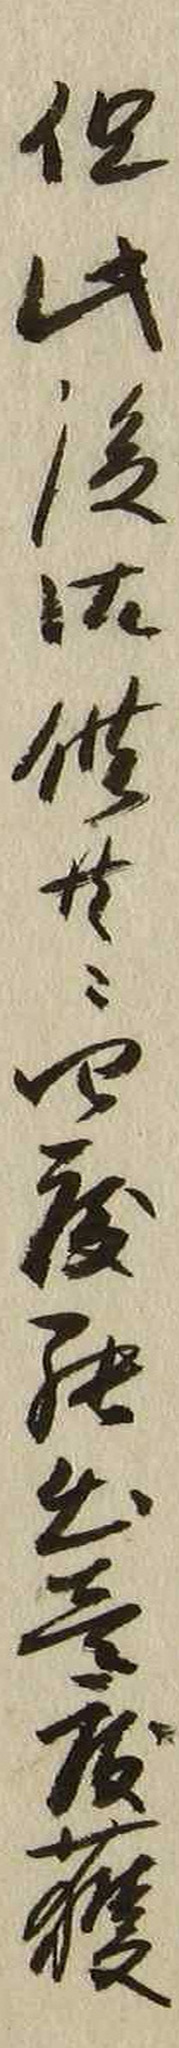但此後御供共々四度罷出壱度獲
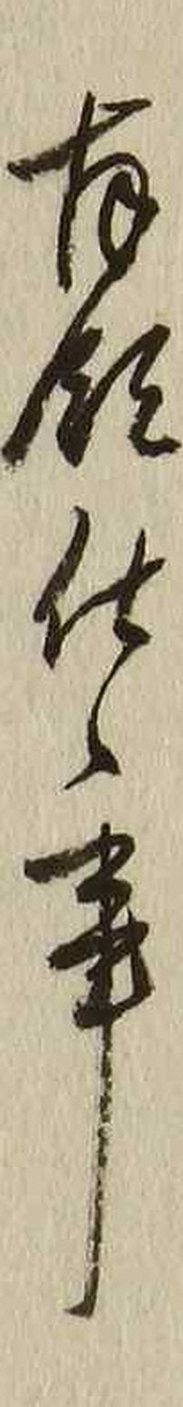拝領仕候事
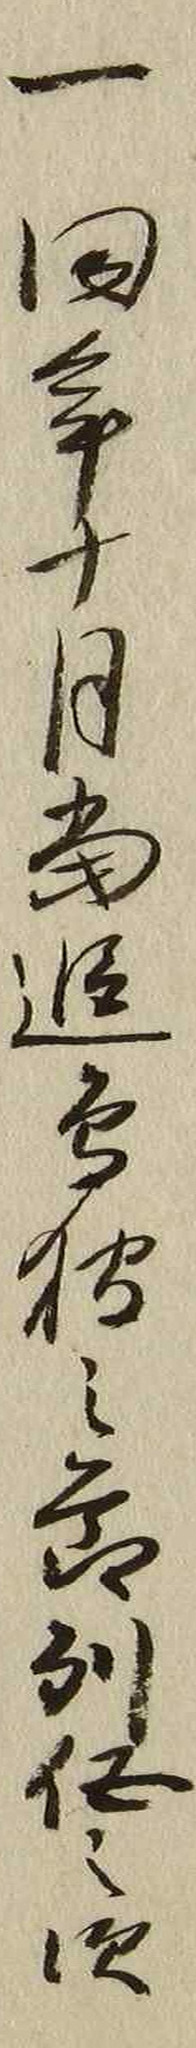一同年十月当追鳥狩之節列伍之次
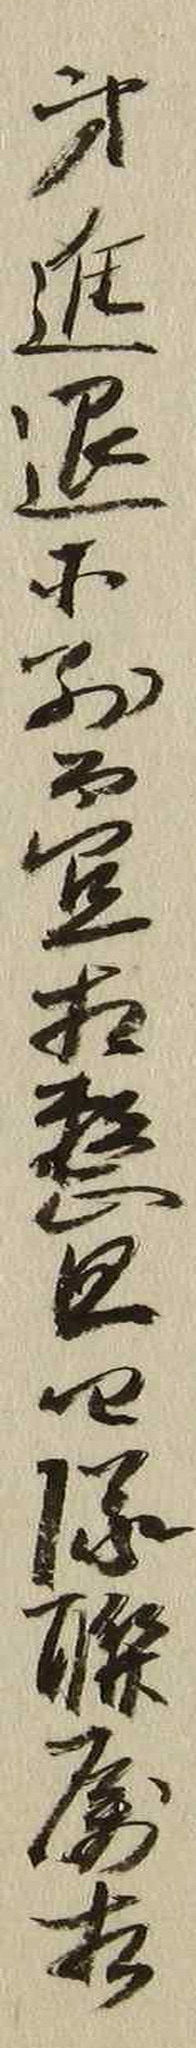第進退等別而宜相整且四隊聯属相
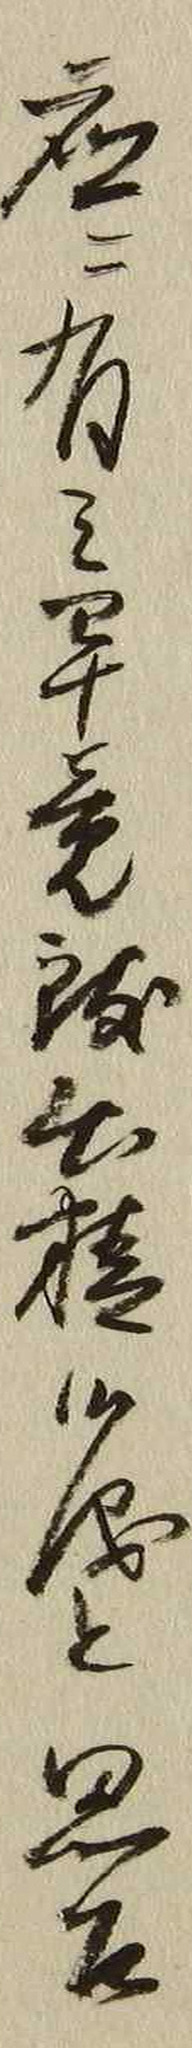応ニ有之畢竟致出精候儀と思召
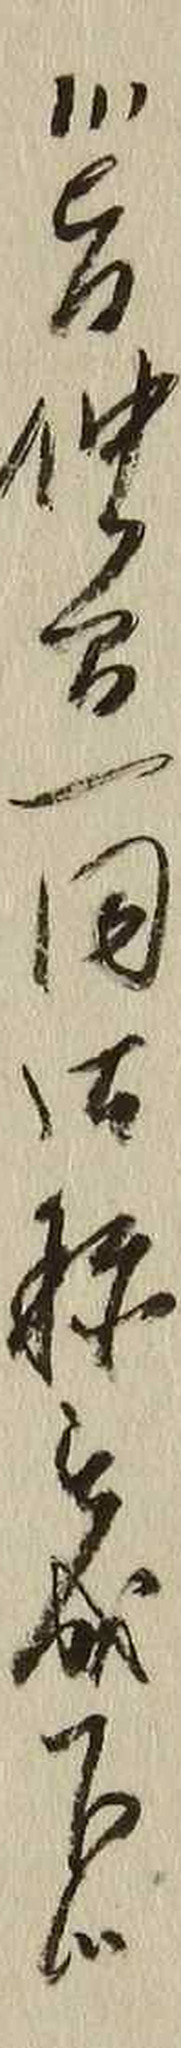候旨仲ケ間一同御称被成下候
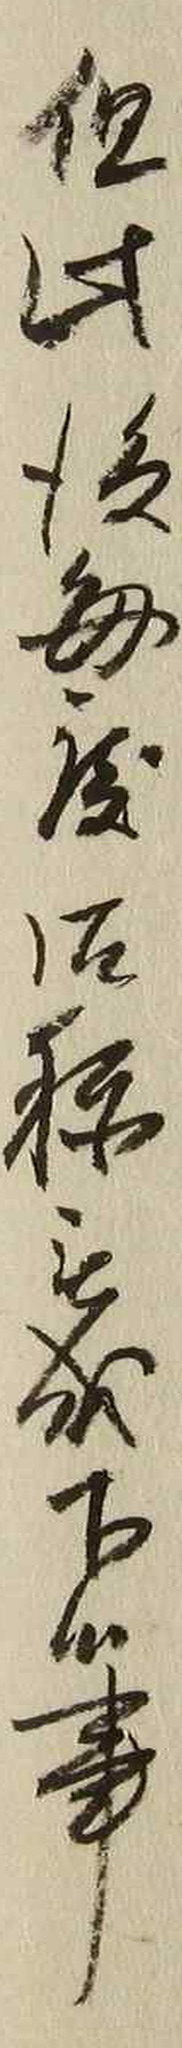但此後毎度御称被成下候事
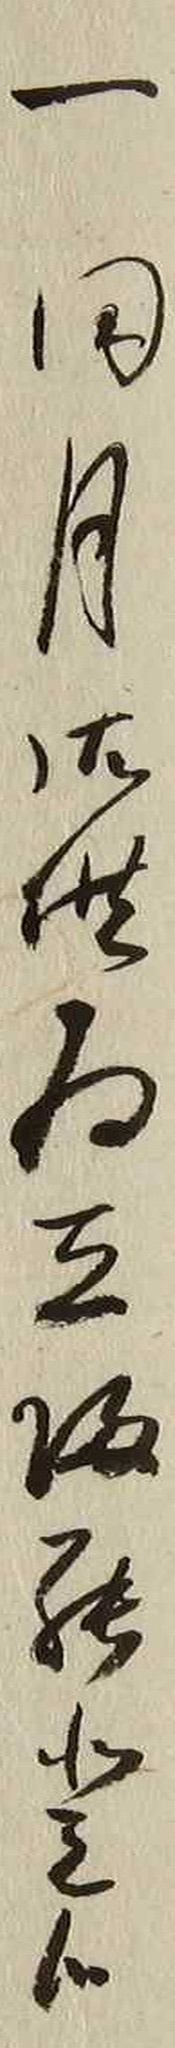一同月御供為立帰罷登候
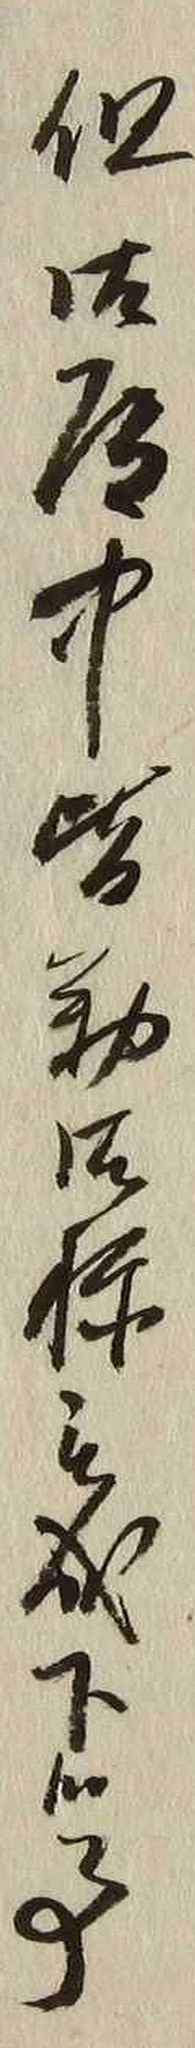但御道中皆勤御称被成下候事
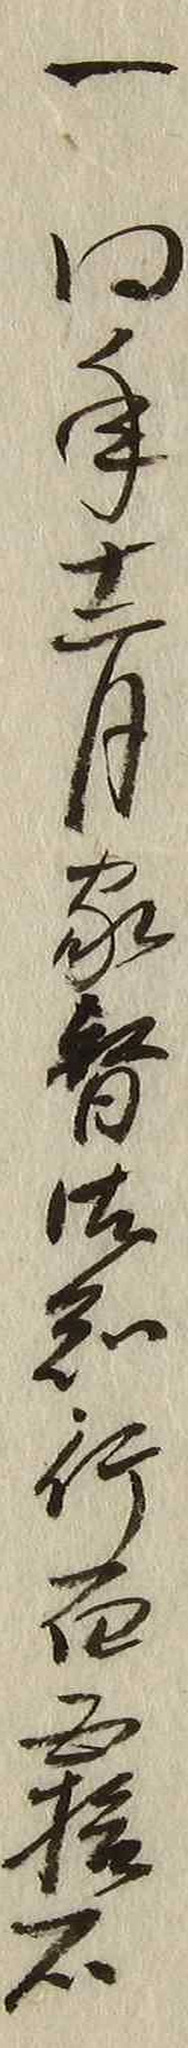一同年十二月家督御知行百五拾石
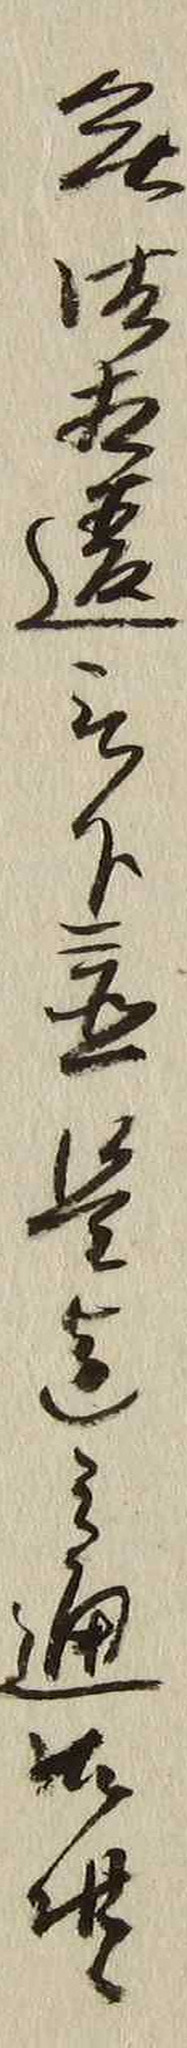無御相違被下置是迄之通御供
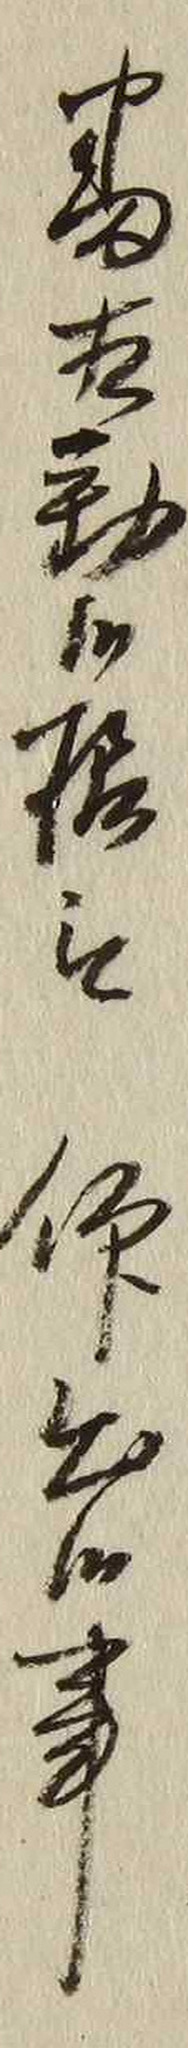番相勤候様被仰出候事
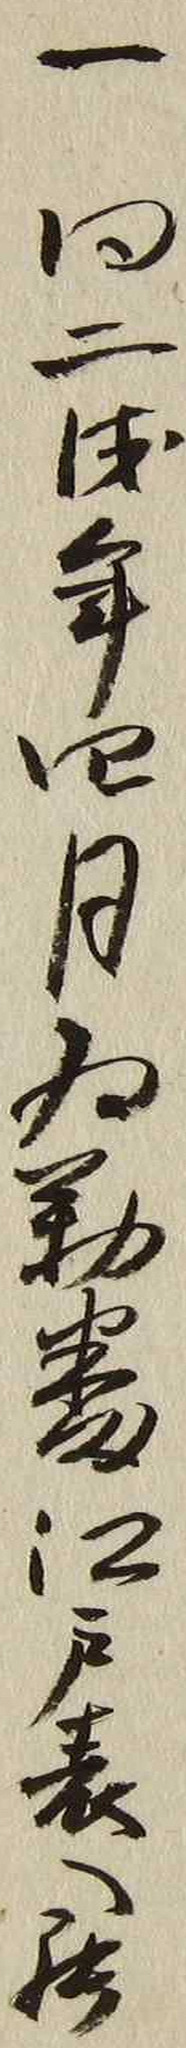一同二戊年四月為勤番江戸表へ罷
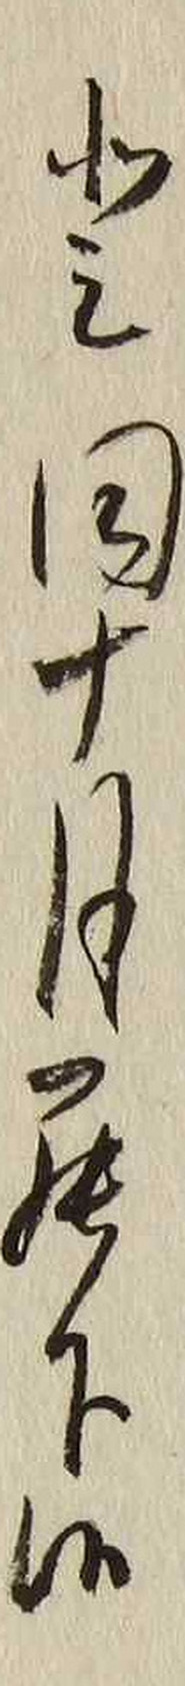登同十月罷下候
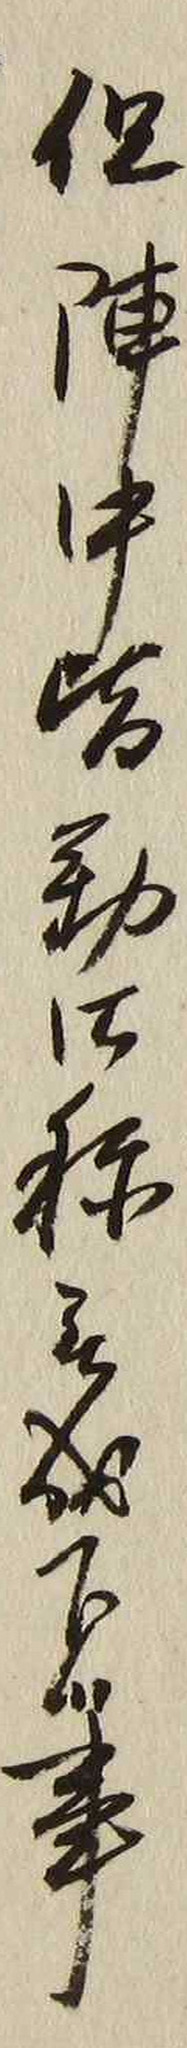但陣中皆勤御称被成下候事
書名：諸士系譜　巻之346　も之部2
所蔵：会津若松市立会津図書館
